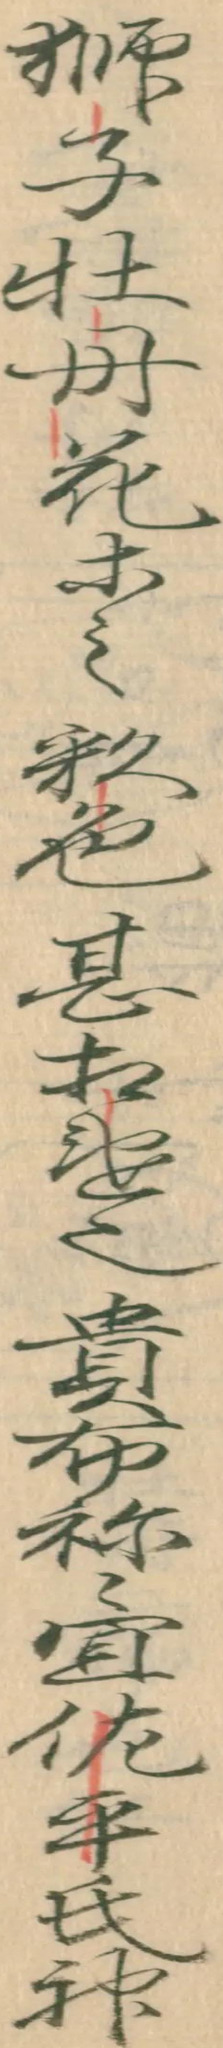獅-子牡-丹_花等之彩-色甚相-違也貴布祢々宜佐平氏神

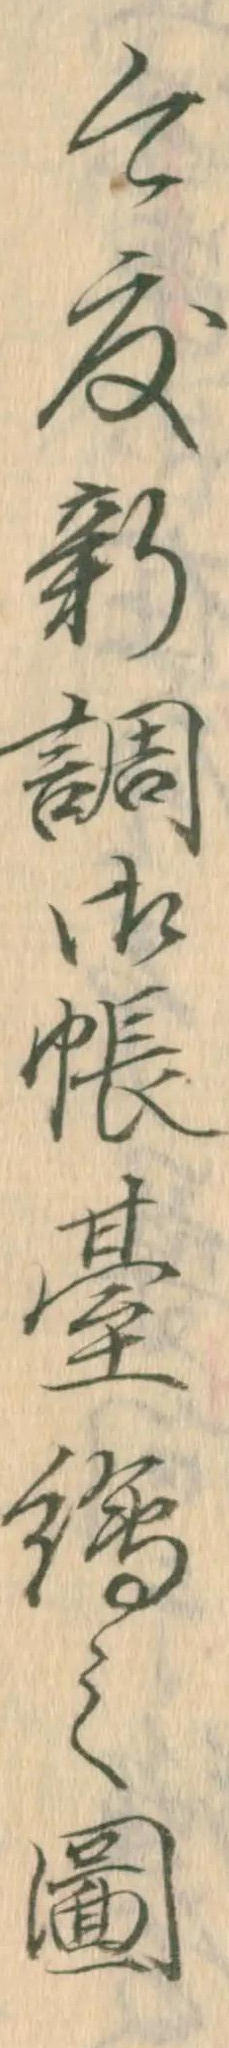今度新調御帳台絵之図

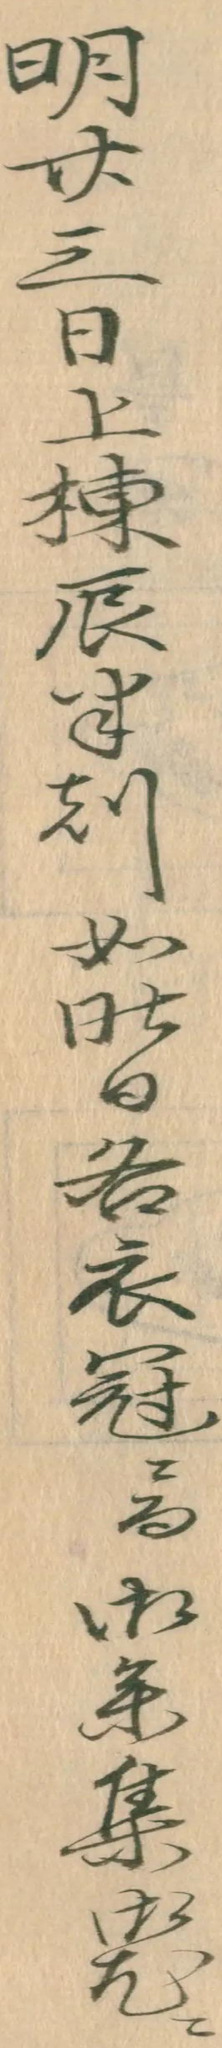明廿三日上棟辰半刻如昨日各衣冠ニ而御参集御尤ニ
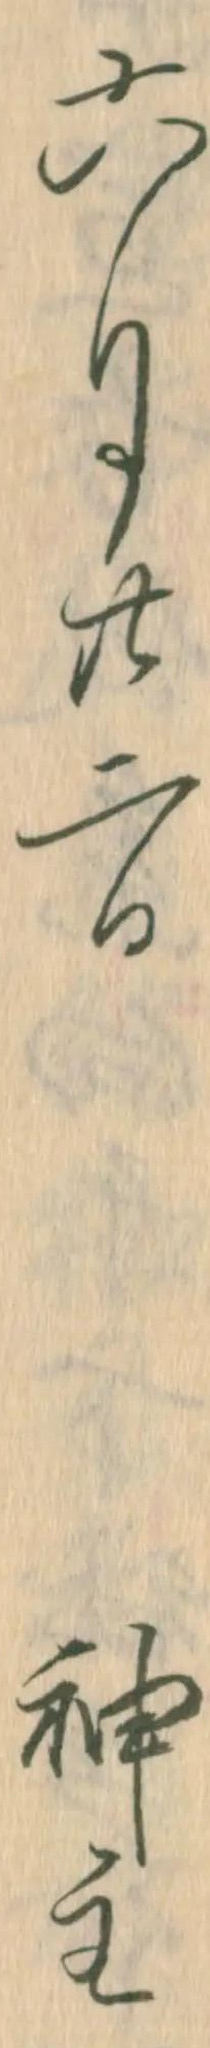六月廿二日神主
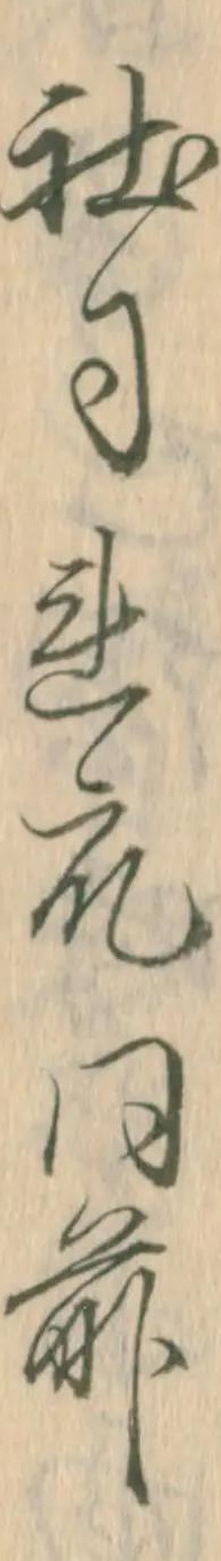社司連衆同前
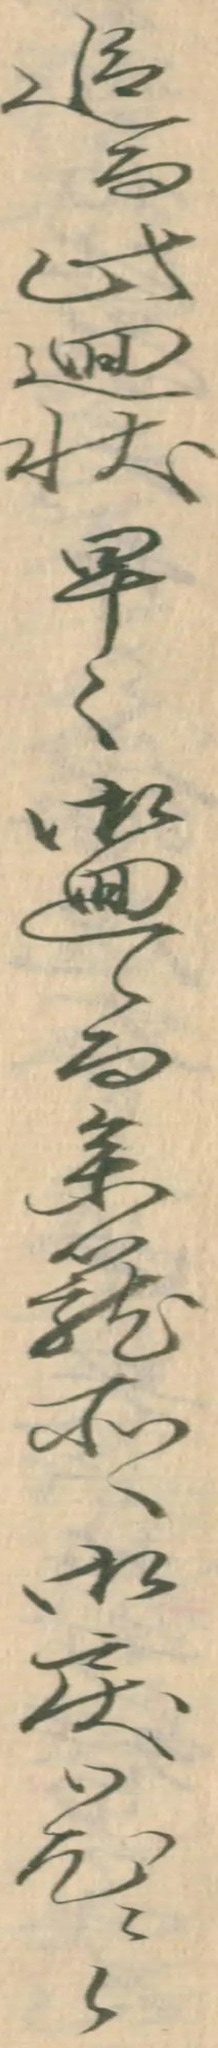追而此廻状早々御廻候而参籠所へ御戻御尤ニ候
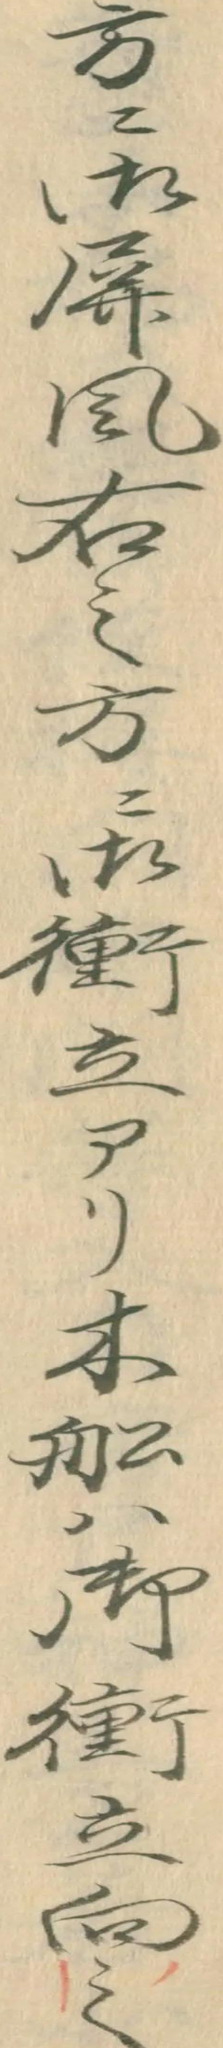方ニ御屏風右之方ニ御衝立アリ木船ハ御衝立向_之

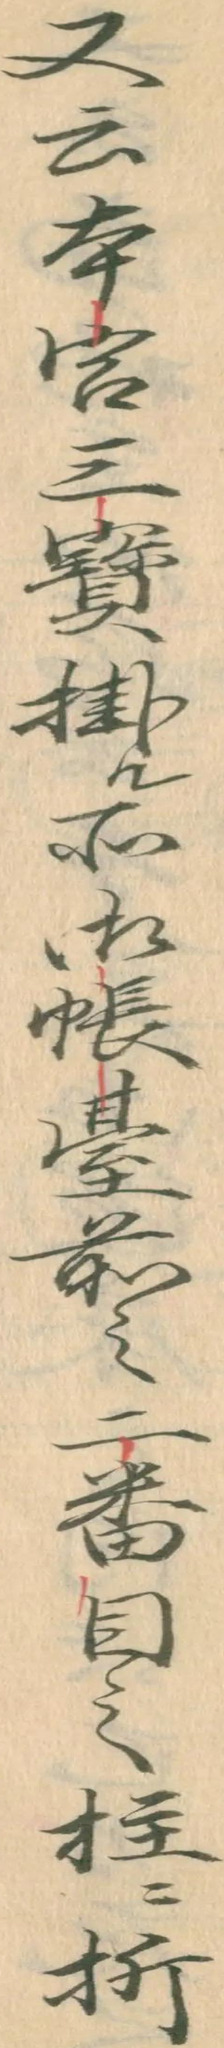又云本-宮三-宝掛ル所御-帳-台前之二-番_目之柱ニ折
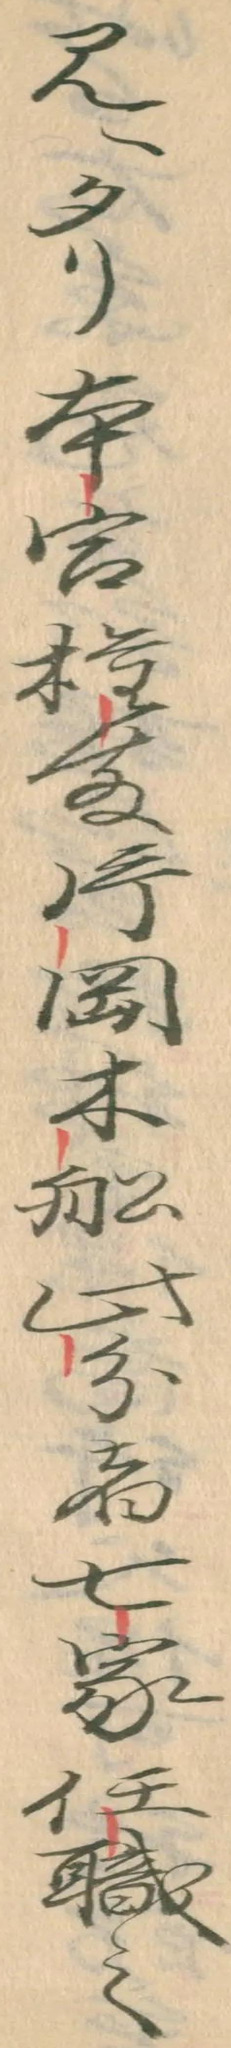見ヘタリ本-宮権-殿片_岡木_船此_分者七-家任-職之
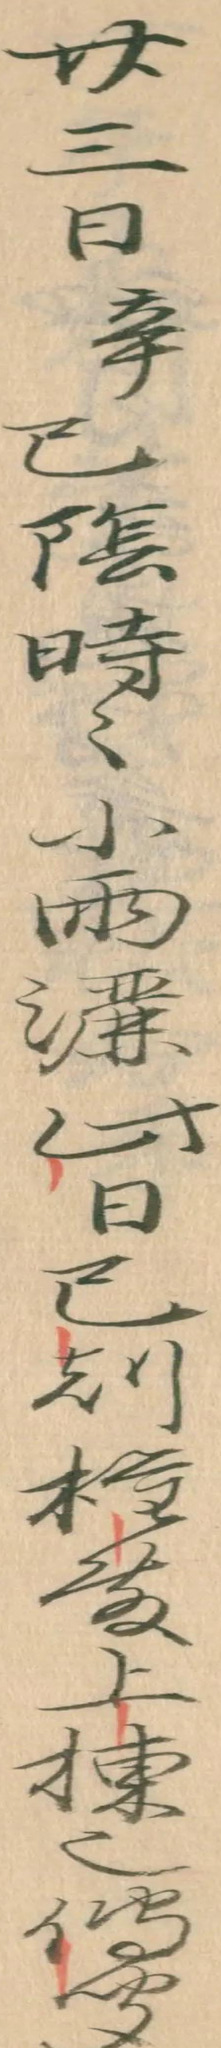廿三日辛巳陰時々小雨灑此_日巳_刻権-殿上-棟也伝_聞

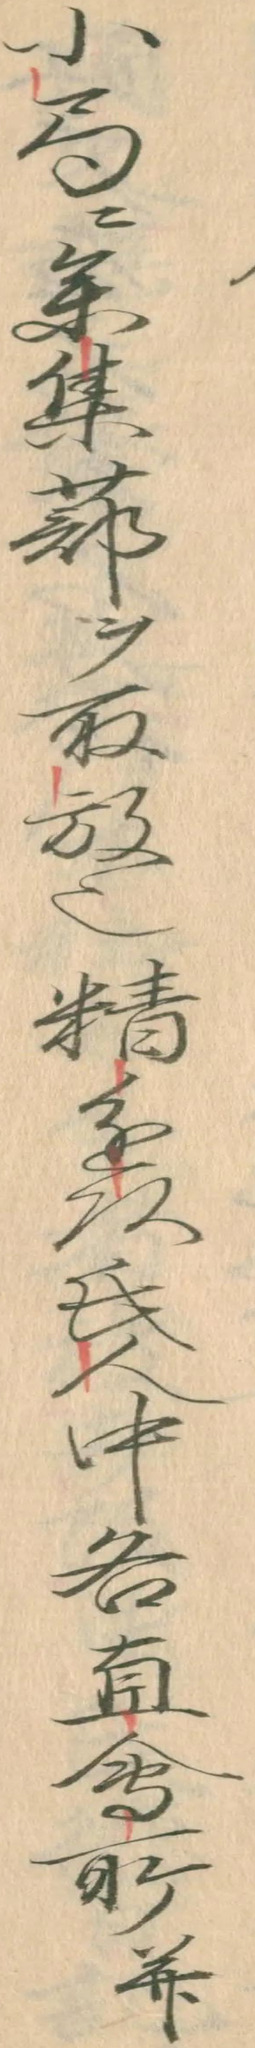小_局ニ参-集蔀ヲ取_放也精-進-頭氏中各直-会-所并

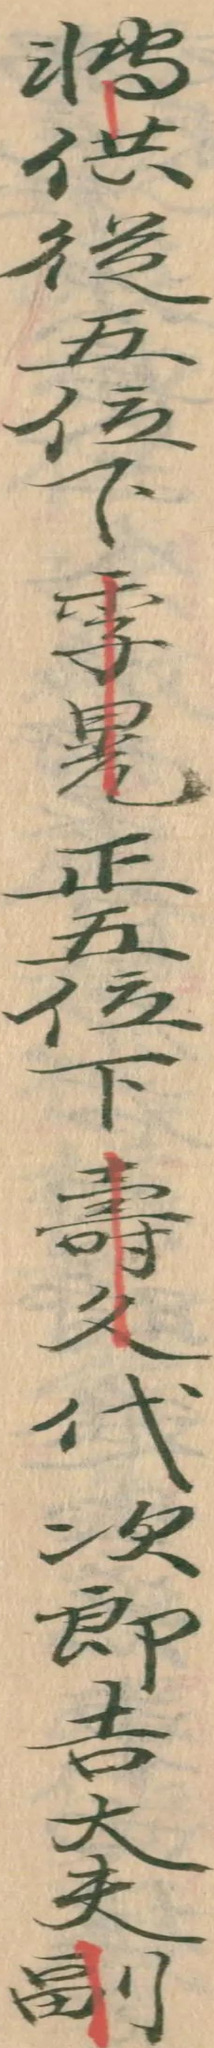転-供従五位下季晃正五位下壽久代次郎吉大夫副
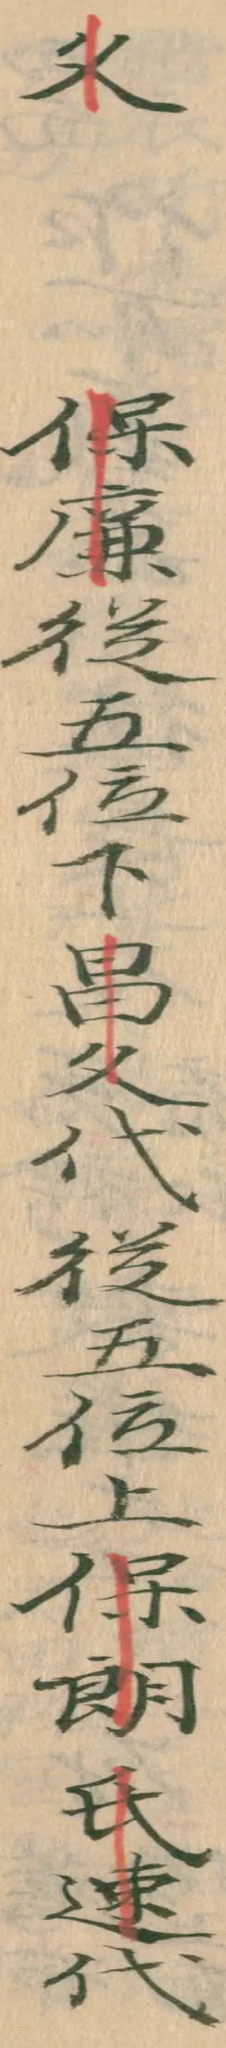久保廉従五位下昌久代従五位上保朗氏速代
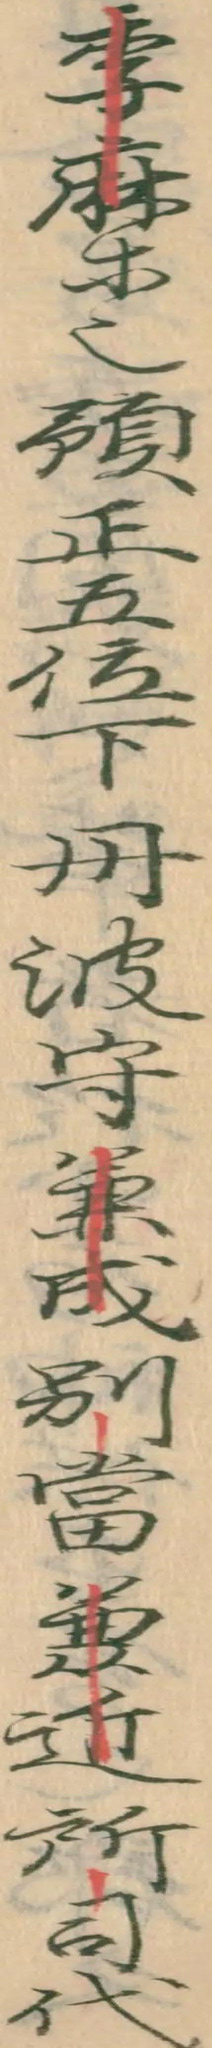季麻等也預正五位下丹波守兼成別-当兼近所-司代
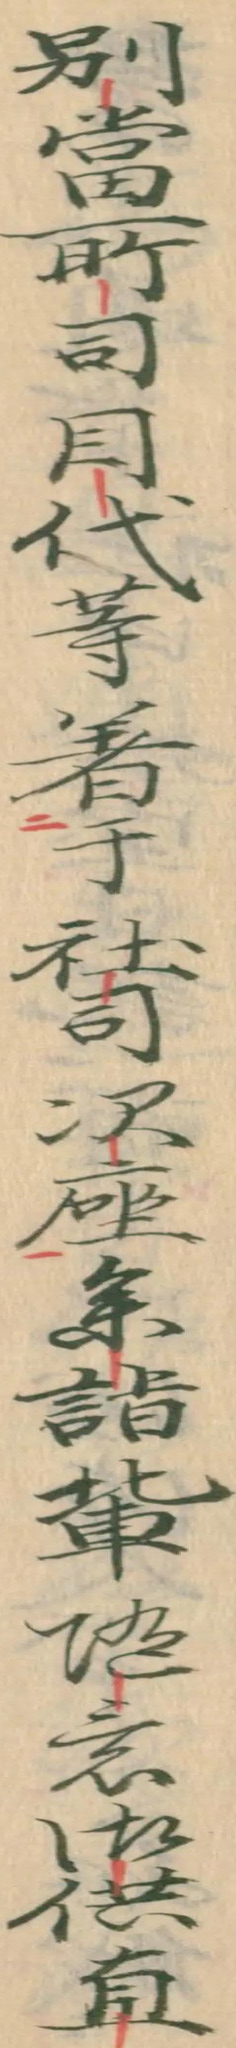別-当所-司目-代等着于社-司次-座参-詣輩随-意御-供直-

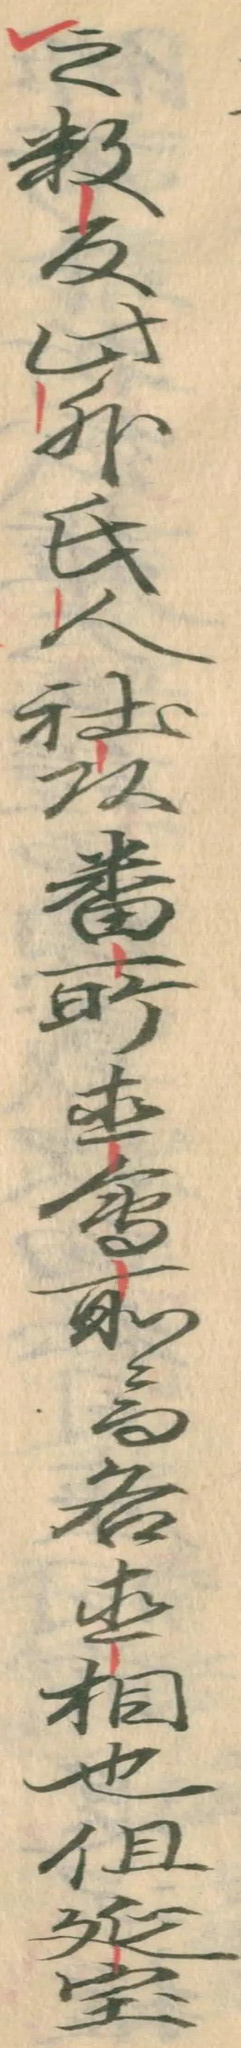之数-反此_外氏社-頭番-所直-会-所ニ而各直-相也但延-宝
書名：賀茂社記録. 第15冊
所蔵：国立国会図書館 National Diet Library, JAPAN
